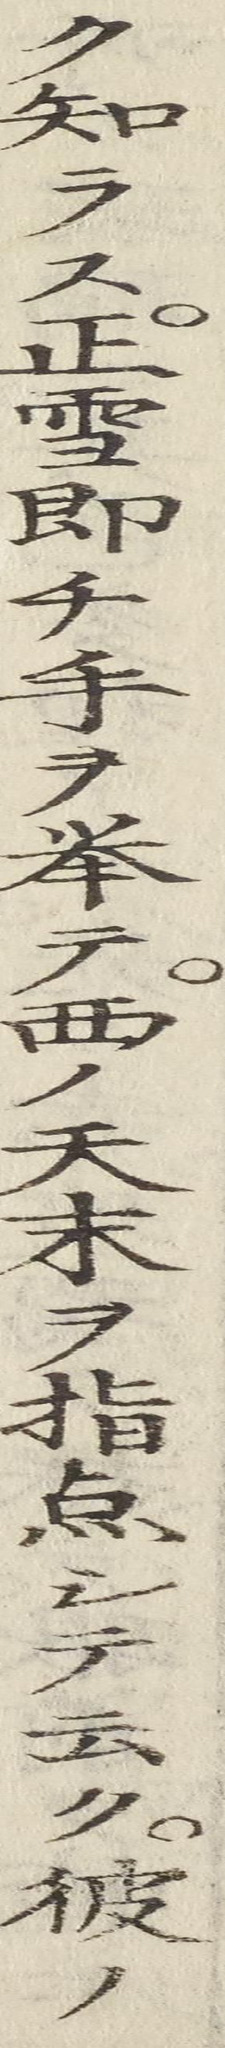ク知ラス。正雪即チ手ヲ挙テ。西ノ天未ヲ指点シテ云ク。彼ノ
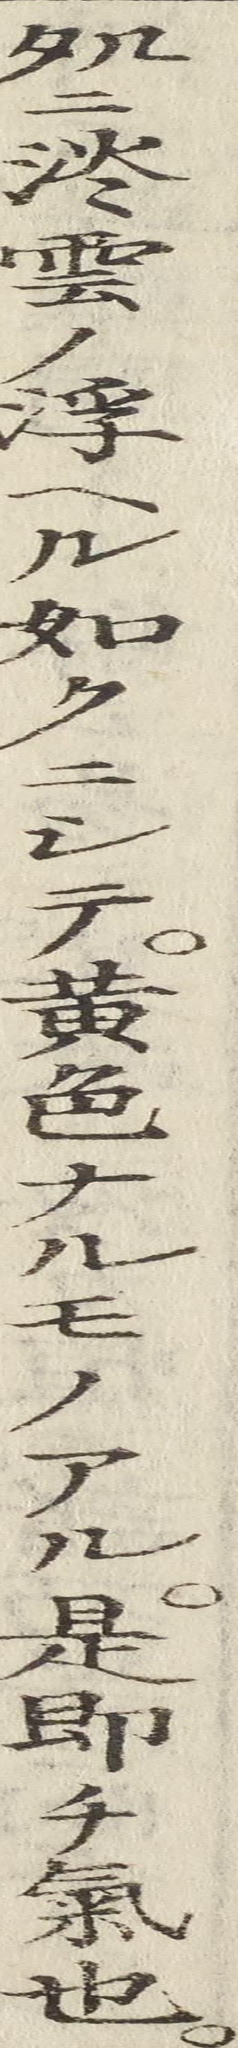処ニ淡雲ノ浮ヘル如クニシテ。黄色ナルモノアル。是即チ気也。
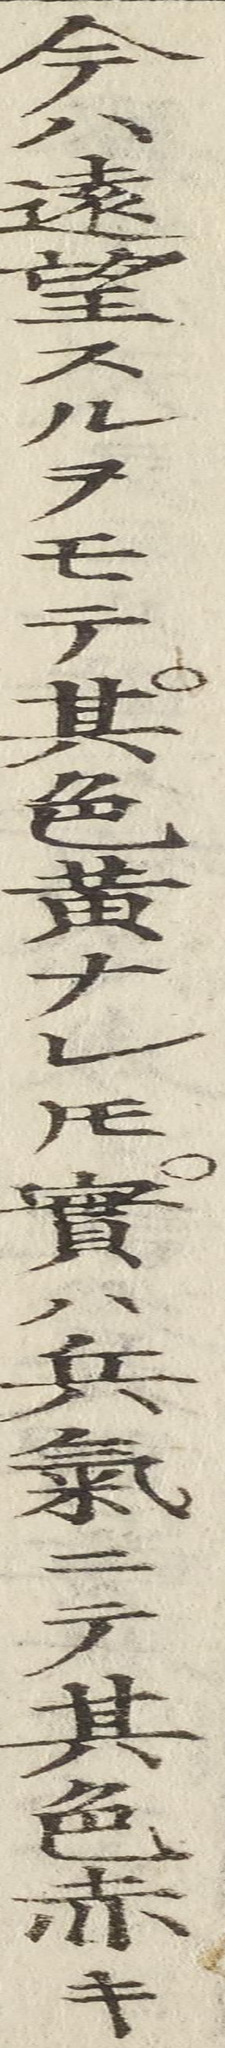今ハ遠望スルヲモテ。其色黄ナレトモ。実ハ兵気ニテ其色赤キ
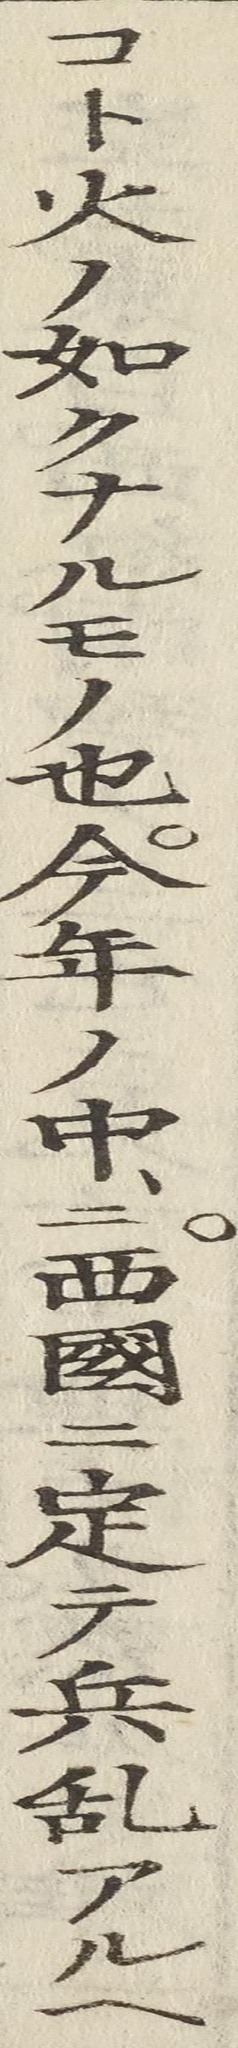コト火ノ如クナルモノ也。今年ノ中‐ニ。西国ニ定テ兵乱アルヘ
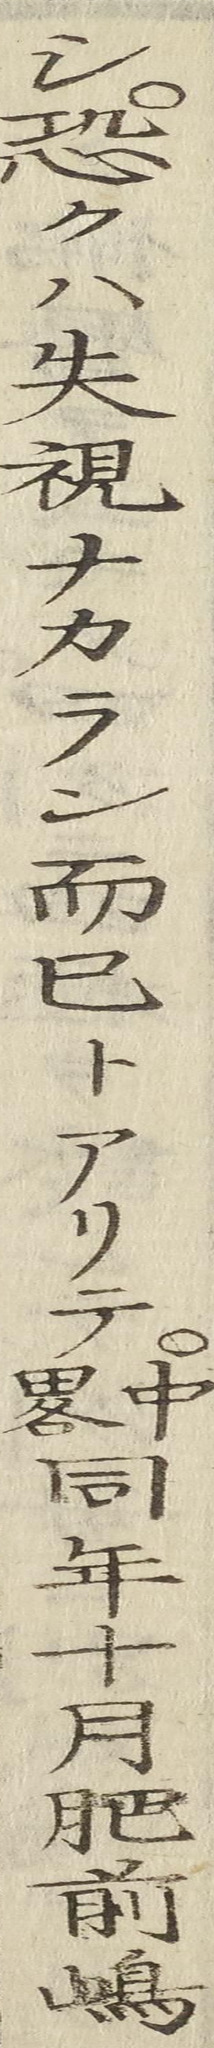シ。恐クハ失視ナカラン而已トアリテ。中略同年十月肥前嶋
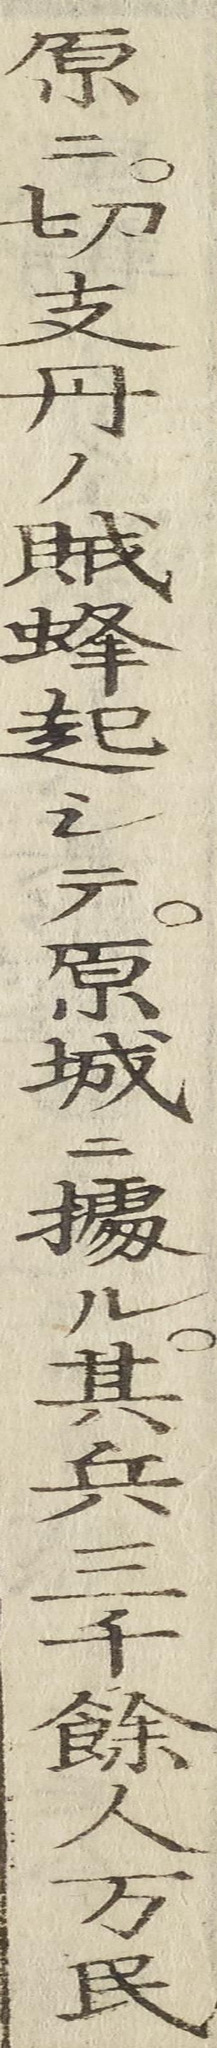原ニ。切支丹ノ賊蜂起シテ。原譲二拠ル。其兵三千余人万民
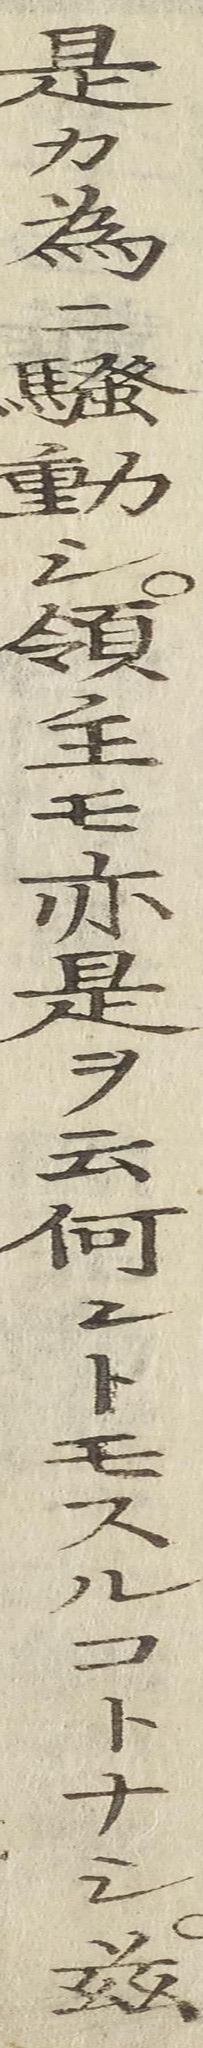是カ為ニ騒動シ。領主モ亦是ヲ云何ントモスルコトナシ。茲
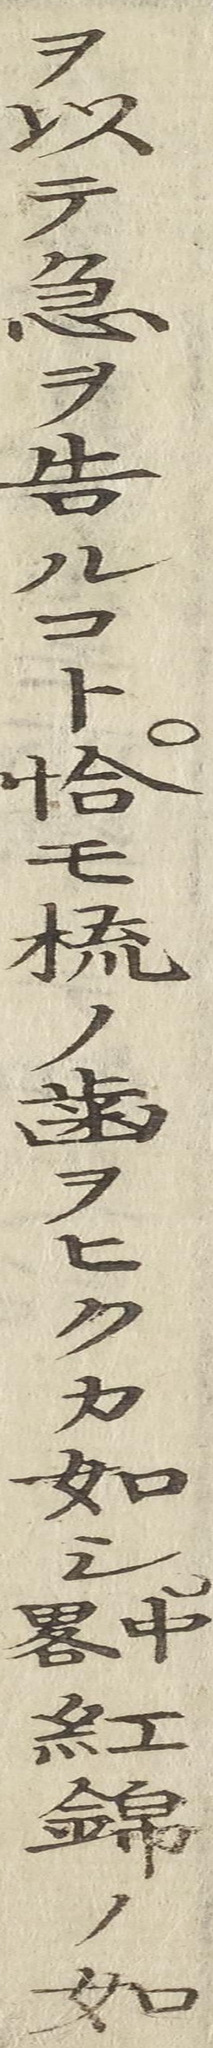ヲ以テ急ヲ告ルコト。恰モ梳ノ歯ヲヒクカ如シ。中略紅錦ノ如
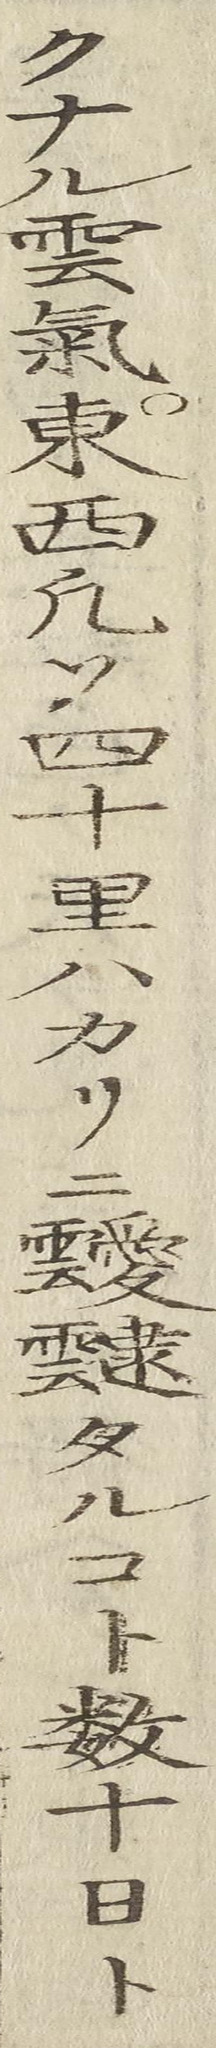クナル雲気。東西凡ソ四十里ハカリニ靉靆タルコト数十日ト
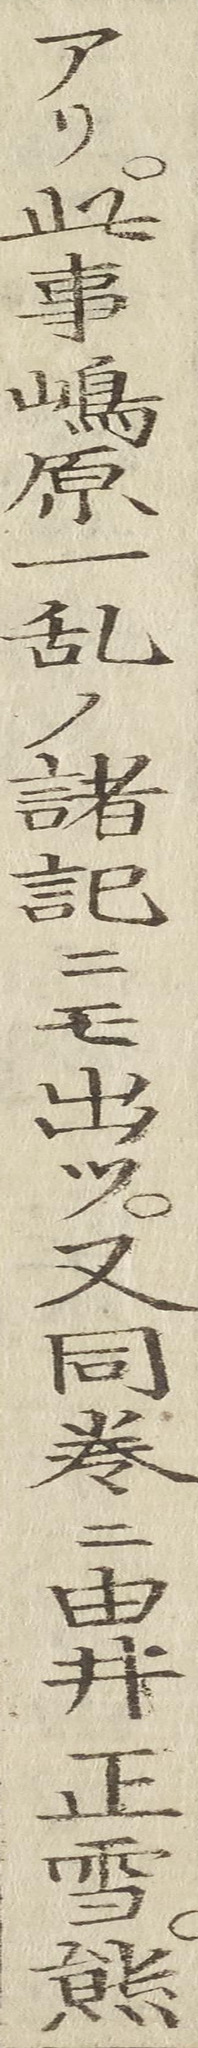アリ。此事嶋原一乱ノ諸記ニモ出ツ。又同巻ニ由井正雪。熊
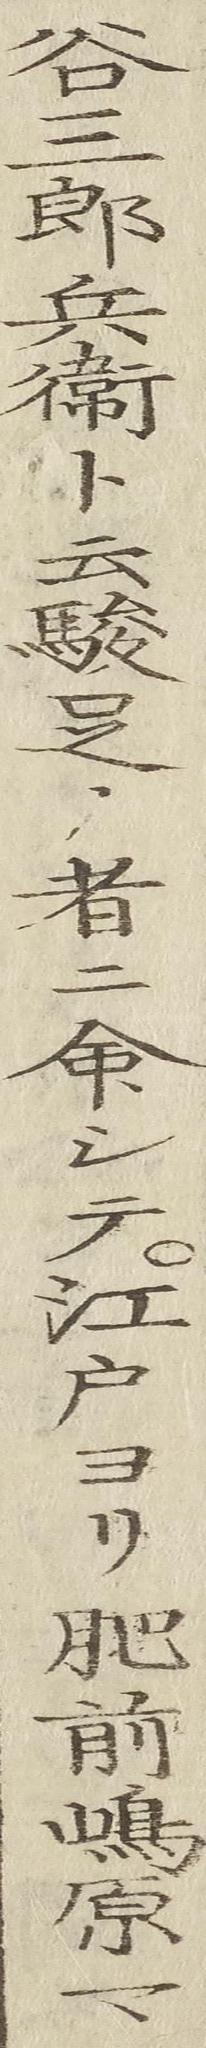谷三郎兵衛ト云駿足ノ者ニ命シテ。江戸ヨリ肥前嶋原マ
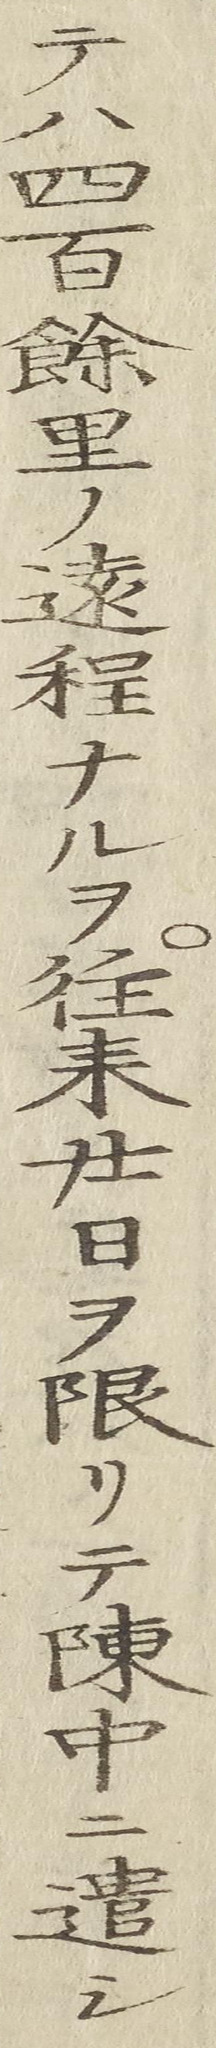テハ四百余里ノ遠程ナルヲ。往来廿日ヲ限リテ陳中ニ遣シ
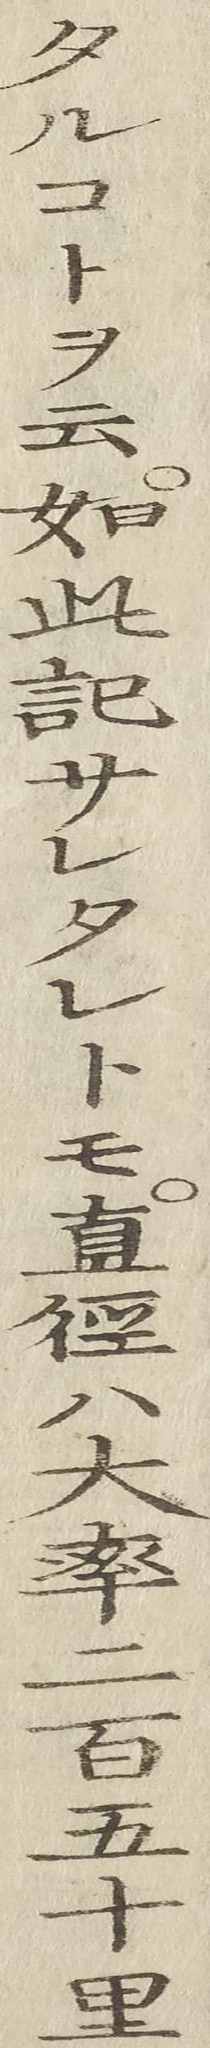タルコトヲ云。如此記サレタレトモ。直径ハ大率二百五十里
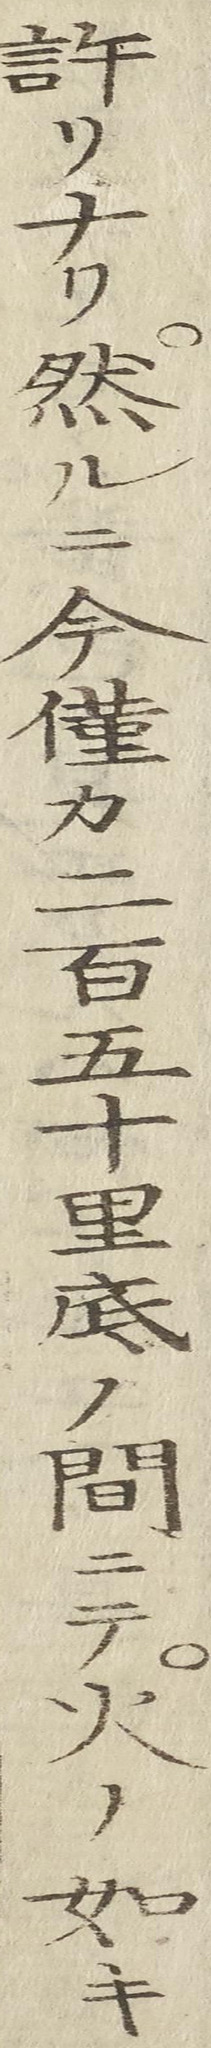許リナリ。然ルニ今僅カ二百五十里底ノ間ニテ。火ノ如キ

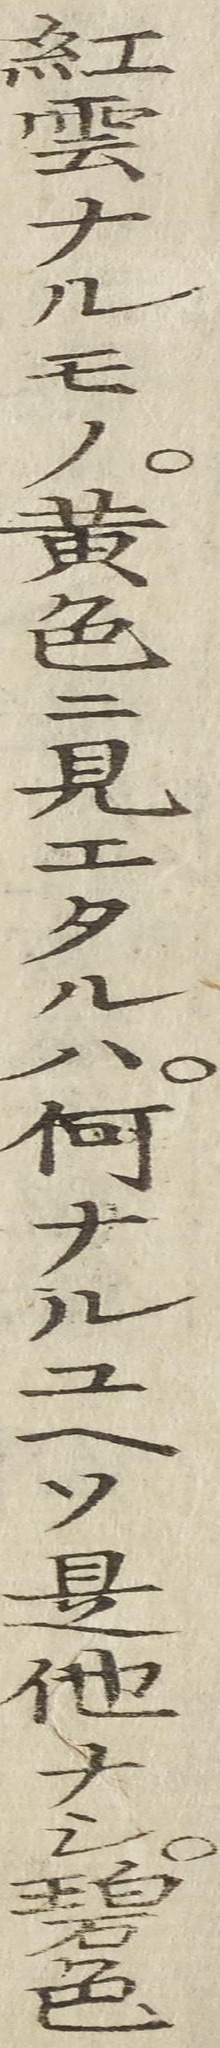紅雲ナルモノ。黄色ニ見エタルハ。何ナルユヘソ是他ナシ。碧色
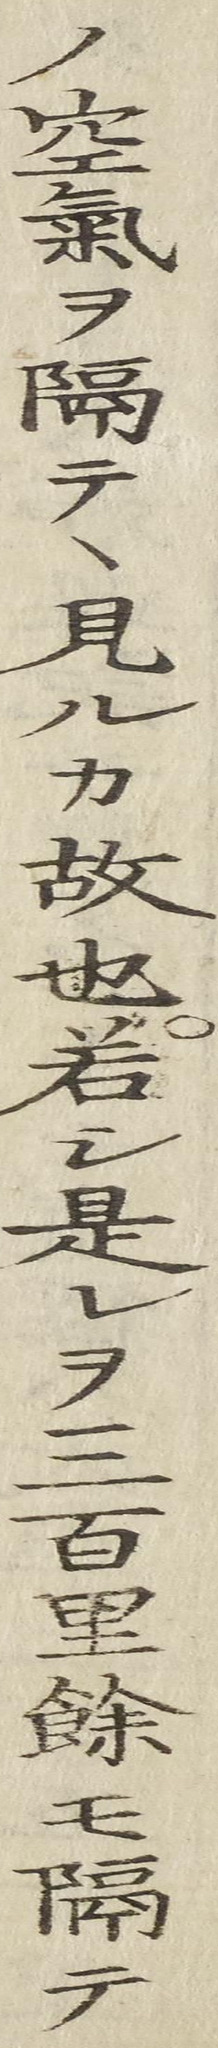ノ空気ヲ隔テヽ見ルカ故也。若シ是レヲ三百里余モ隔テ
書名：護法新論　二編　上
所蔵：東京大学地震研究所図書室 Earthquake Research Institute Library, The University of Tokyo, JAPAN
